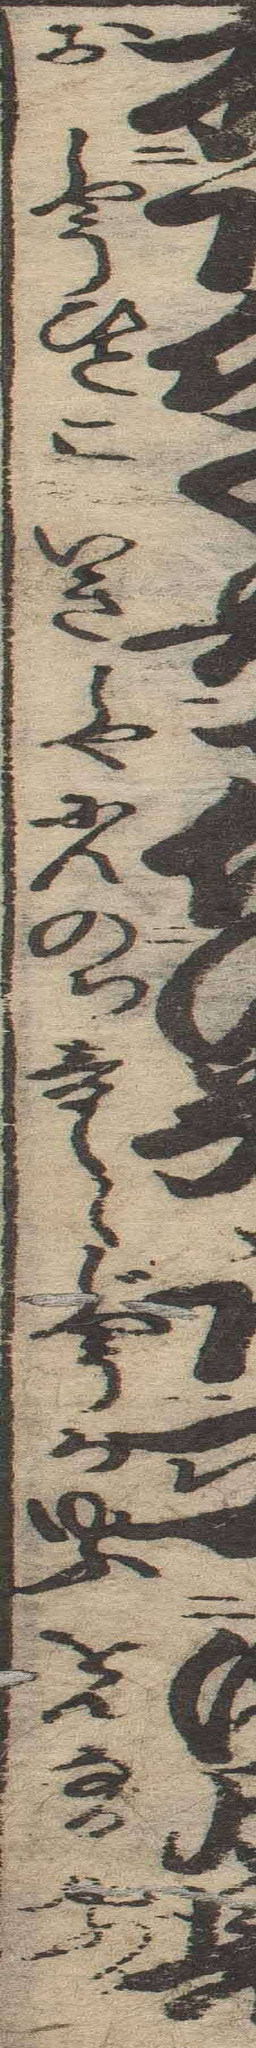おしやうひとこいきしやにんのちしるしじやうかゆふをんなるやぶる

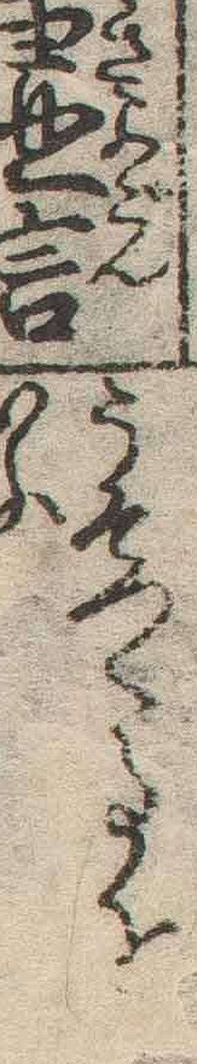虚言うそつく事を
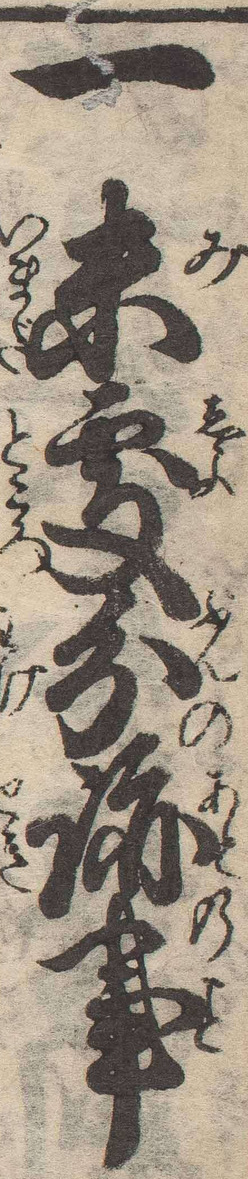一未處分跡事
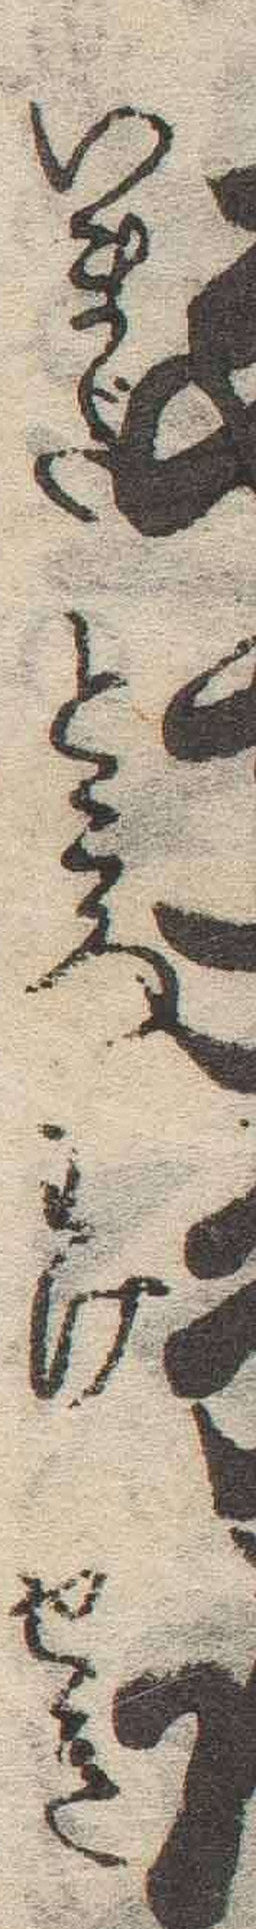いまだところわけせき
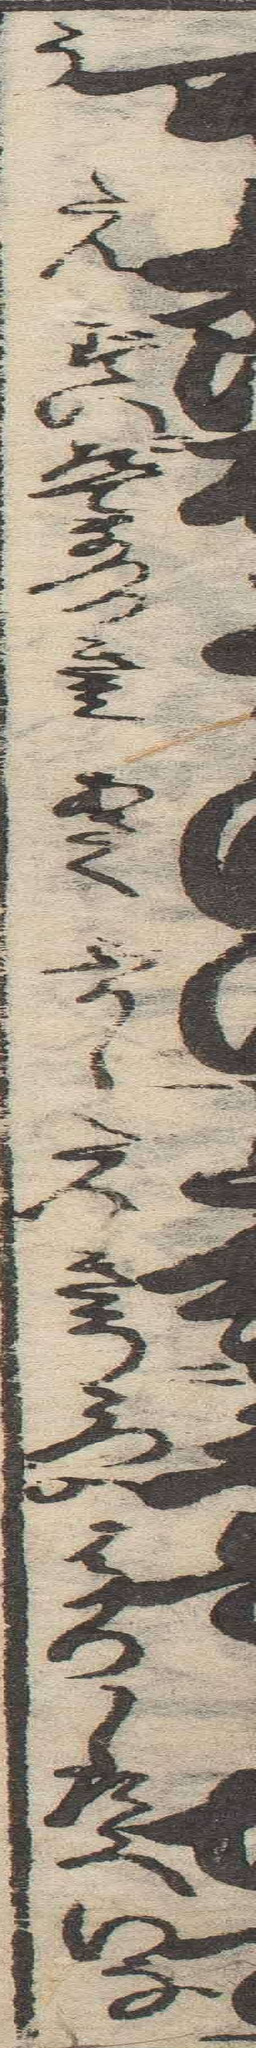うたんずいたてまつるきみあさくふかしたんきううつははかりしたかへいな
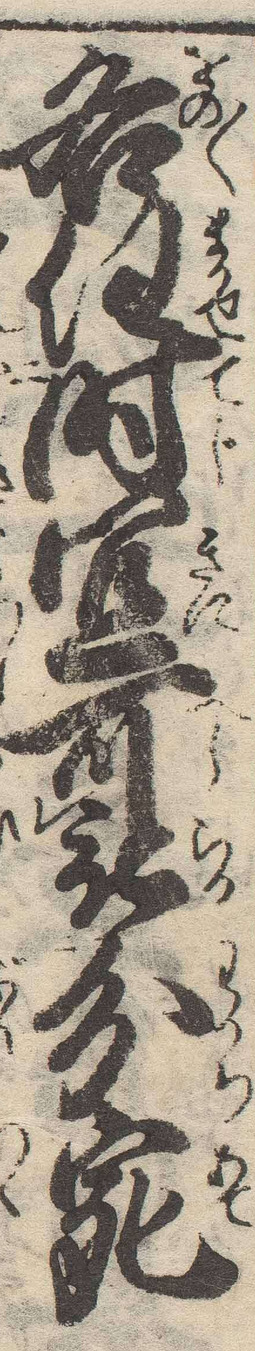各任時宜可被分宛
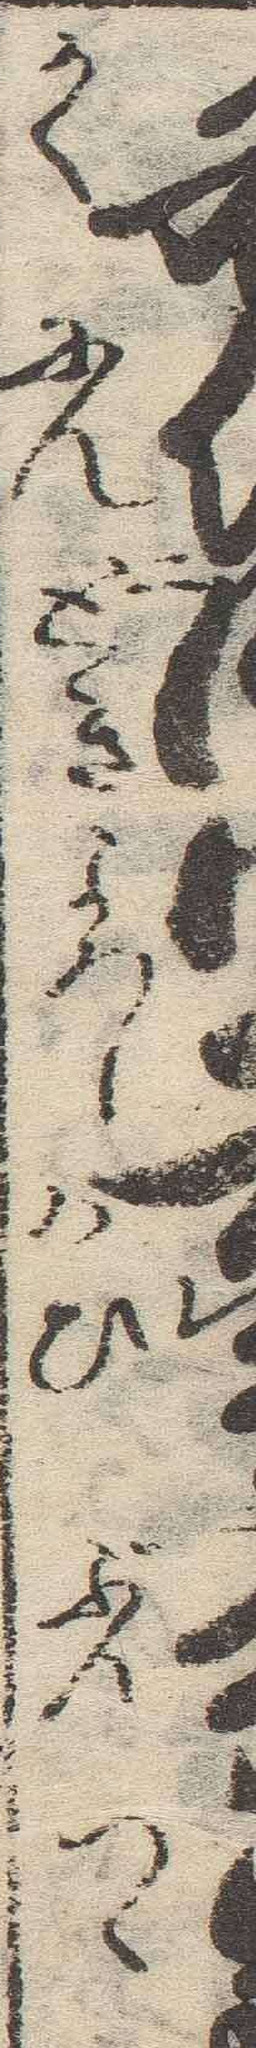かくにんときよろしかひぶんつゝ
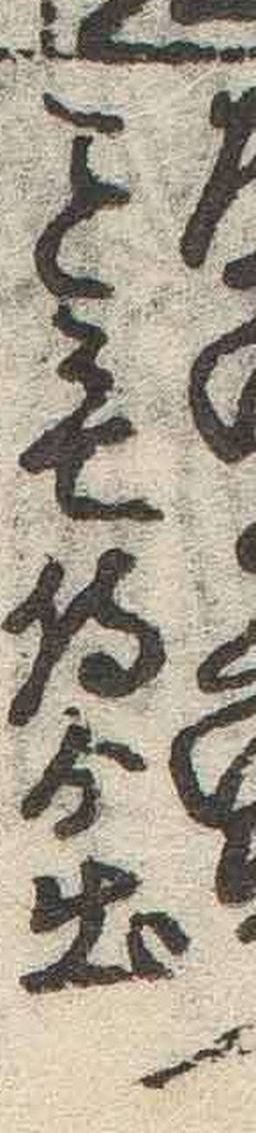ことにて侍ゟ出
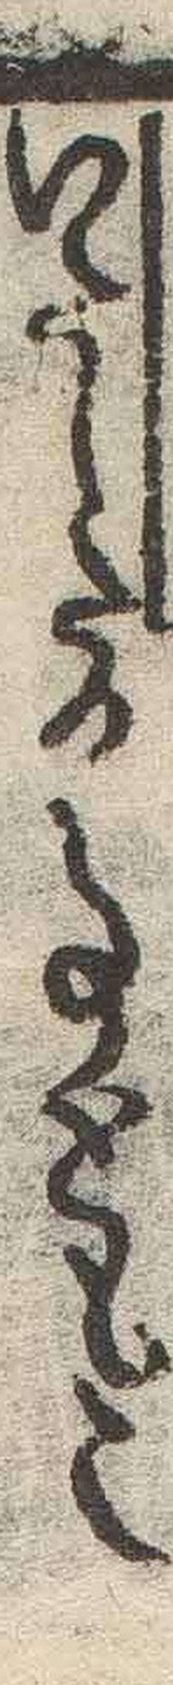いたしたる事とも也
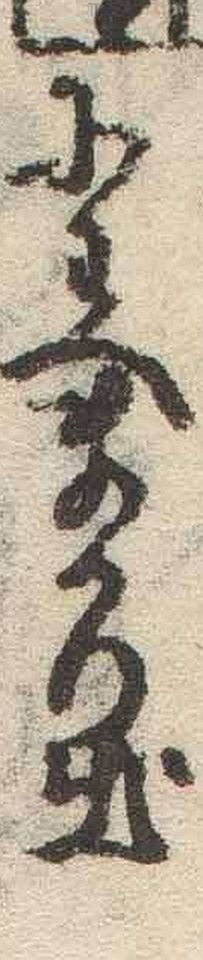にわへまかり出
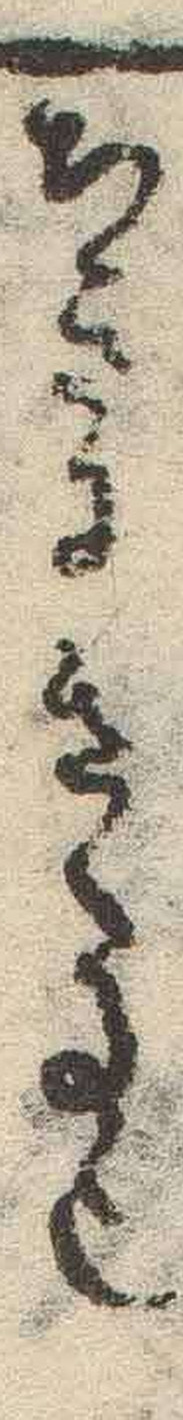ちきにきく事也
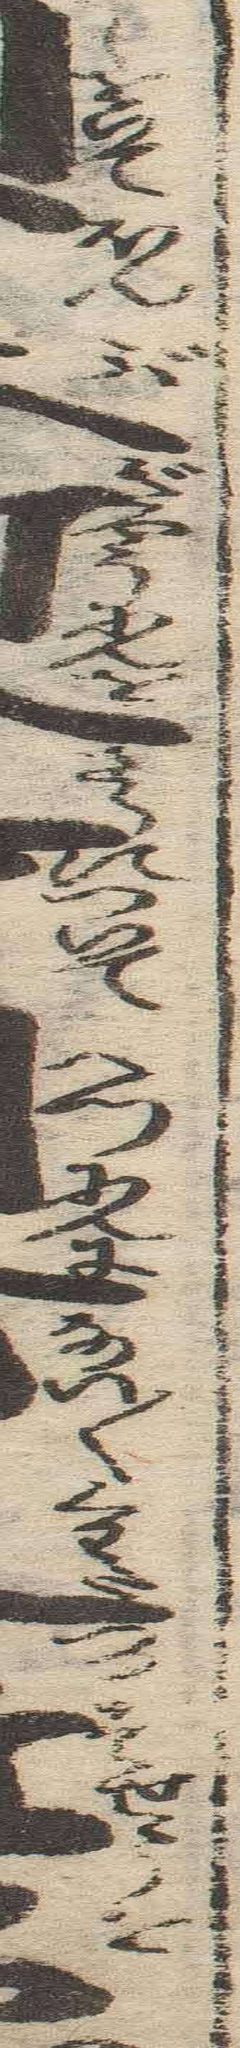みきさしをいてほんぶぎやうにんをさらについてへつにんにない〳〵くわたつるそせうをのあいだ
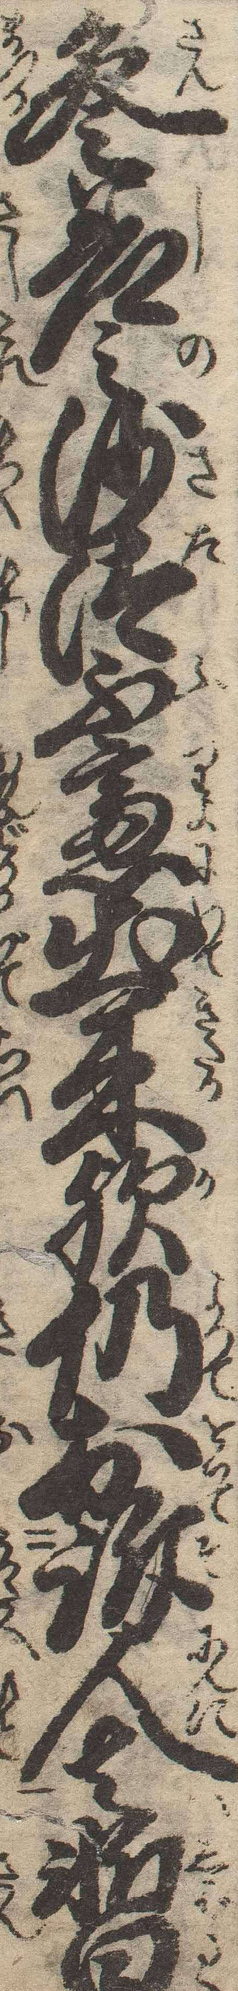参差之沙汰不慮出来欤仍於訴人者暫

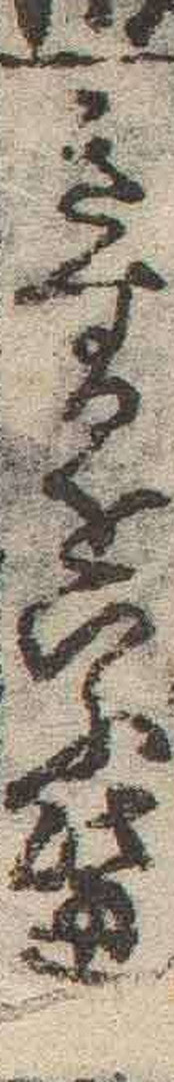きするをいふ此通
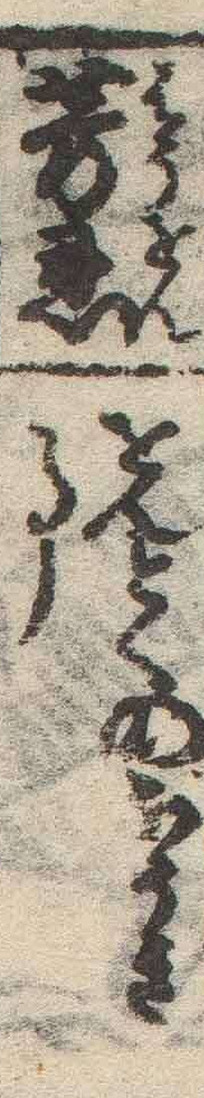芳恩をんとくのあつき
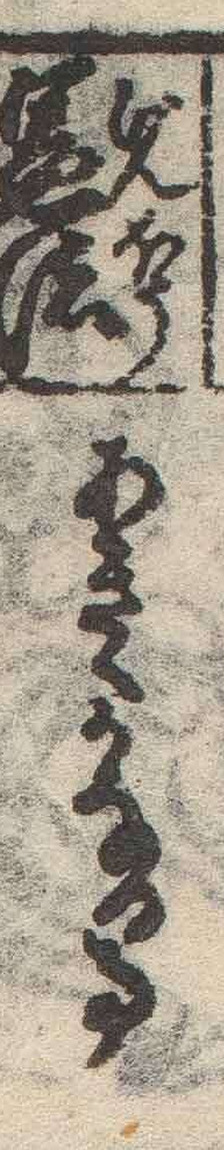憲法あきらかなる事
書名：御成敗式目絵抄
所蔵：東京学芸大学附属図書館 国文学研究資料館
